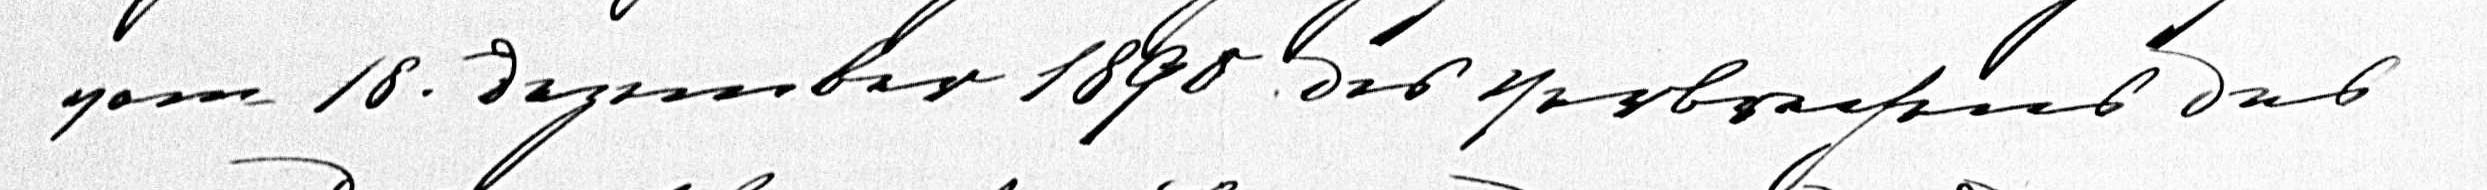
vom 18. Dezember 1898 des Verbrechens des
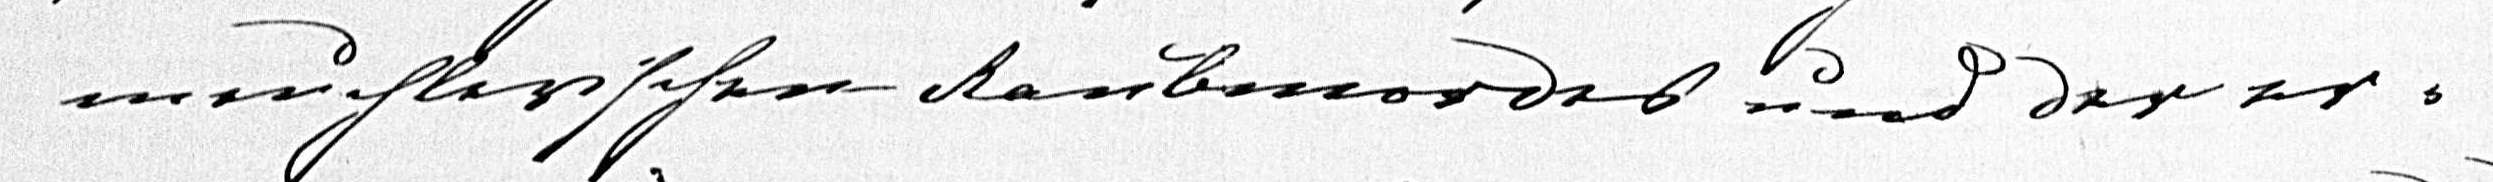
meuchlerischen Raubmordes und der er¬
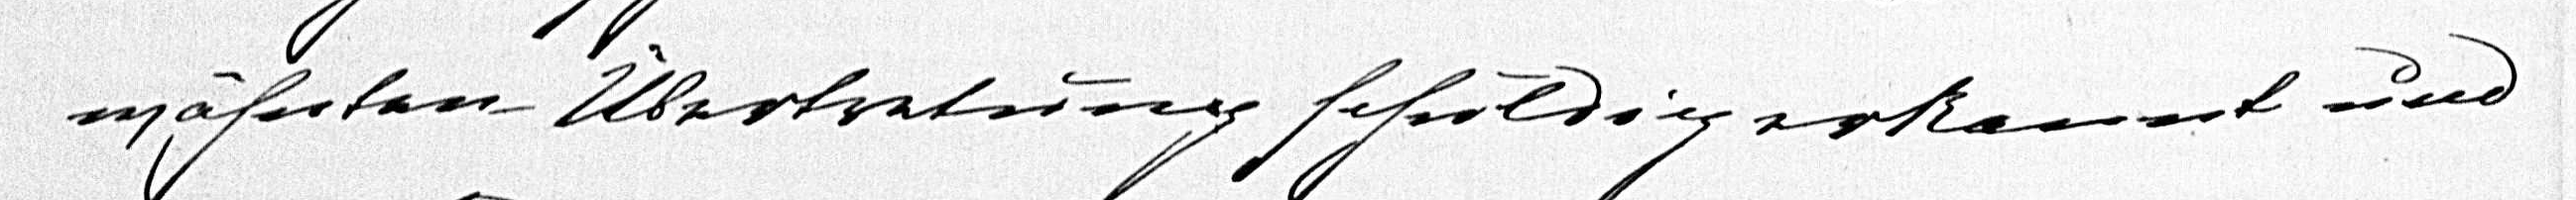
wähnten Übertretung schuldig erkannt und
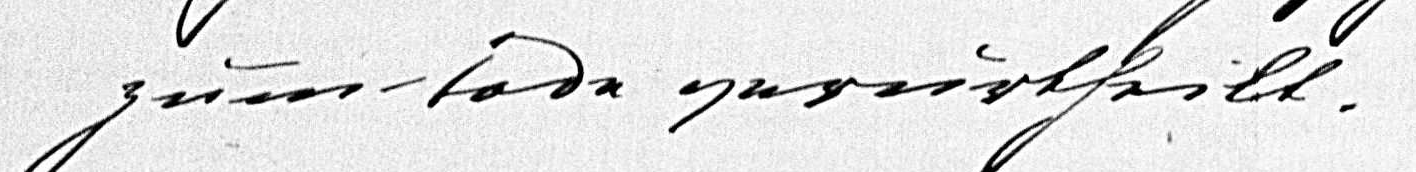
zum Tode verurtheilt.
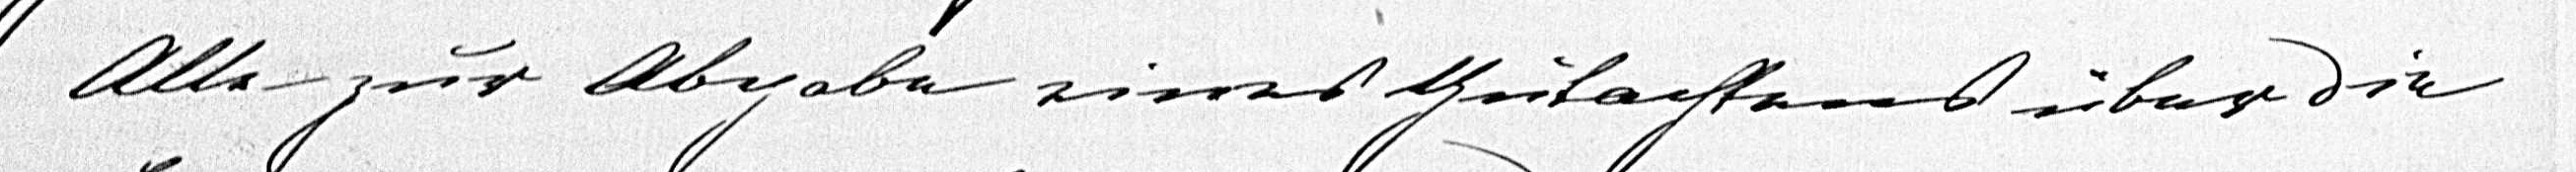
Alle zur Abgabe eines Gutachtens über die
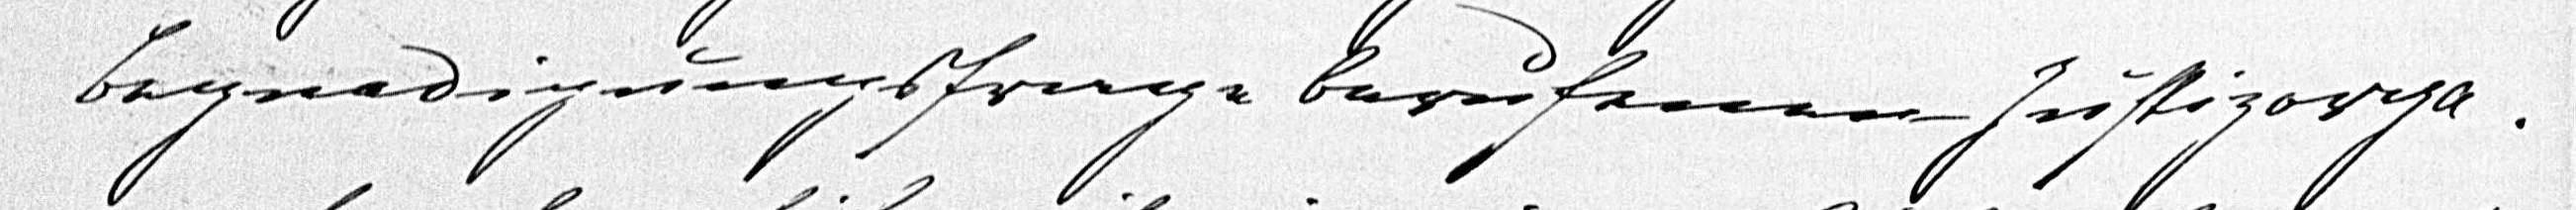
Begnadigungsfrage berufenen Justizorga¬
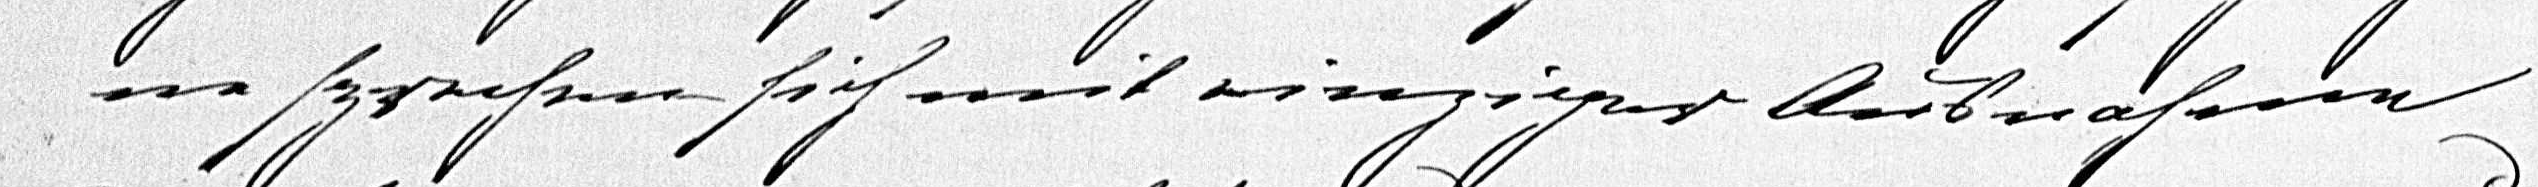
ne sprachen sich mit einziger Ausnahme
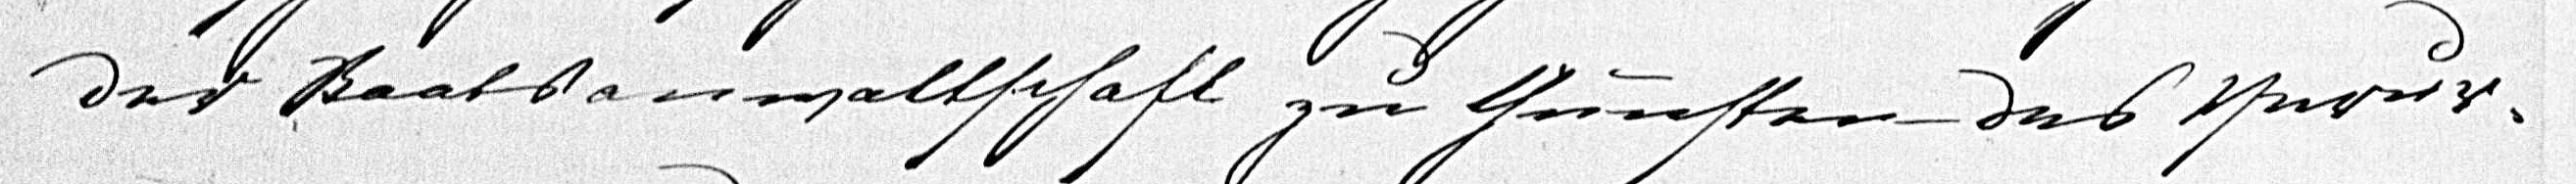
der Staatanwaltschaft zu Gunsten des Verur¬
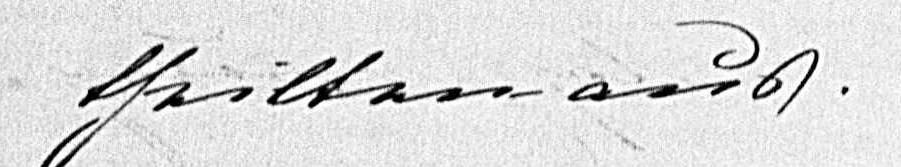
theilten aus.
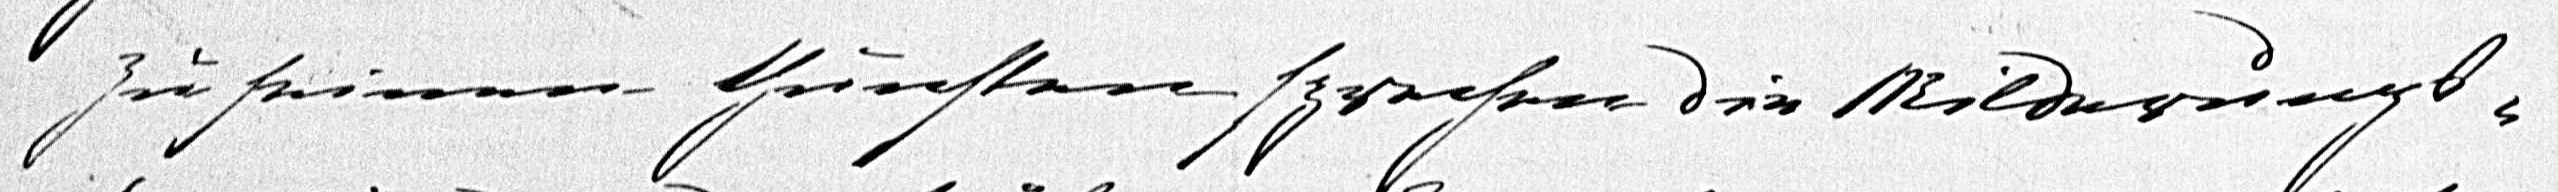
Zu seinen Gunsten sprachen die Milderungs¬
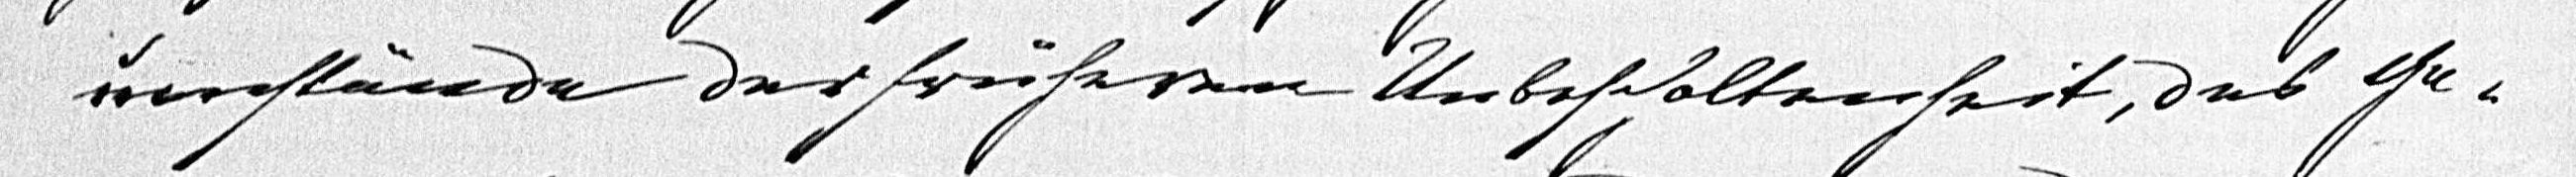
umstände der früheren Unbescholtenheit, das Ge¬
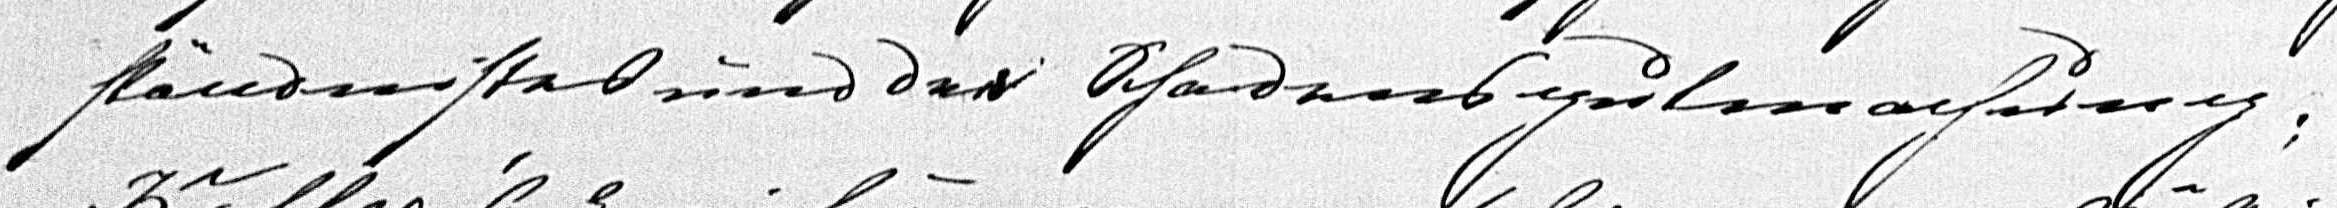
ständnisses und der Schadensgutmachung;
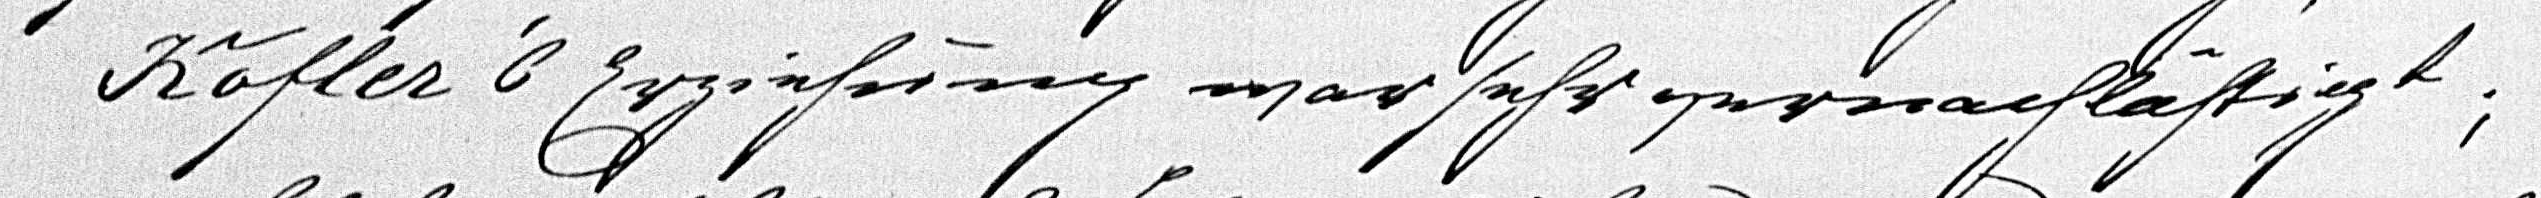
Kofler’s Erziehung war sehr vernachlässigt;
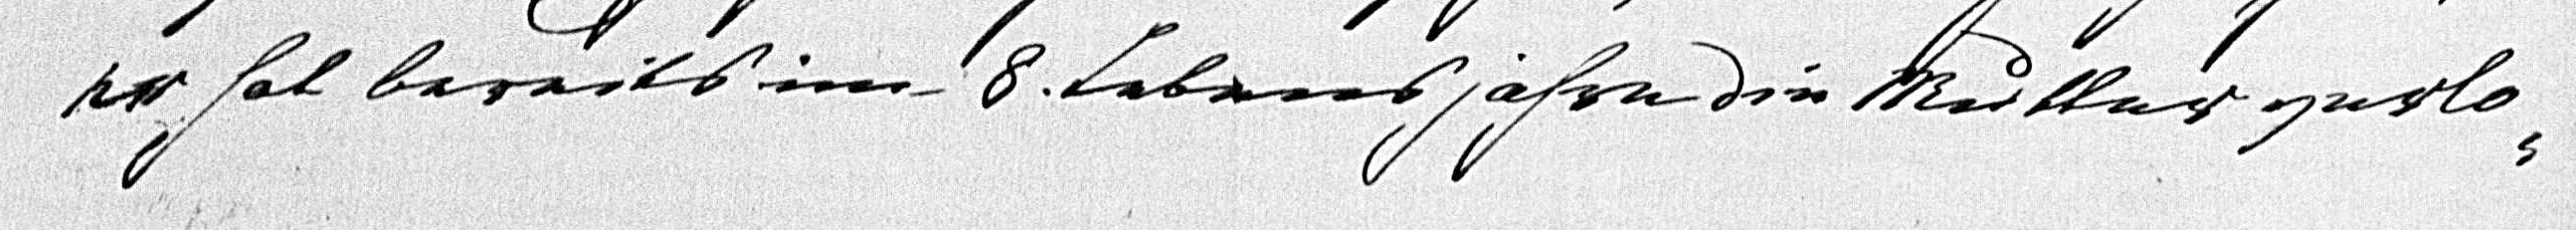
er hat bereits im 8. Lebensjahr die Mutter verlo¬
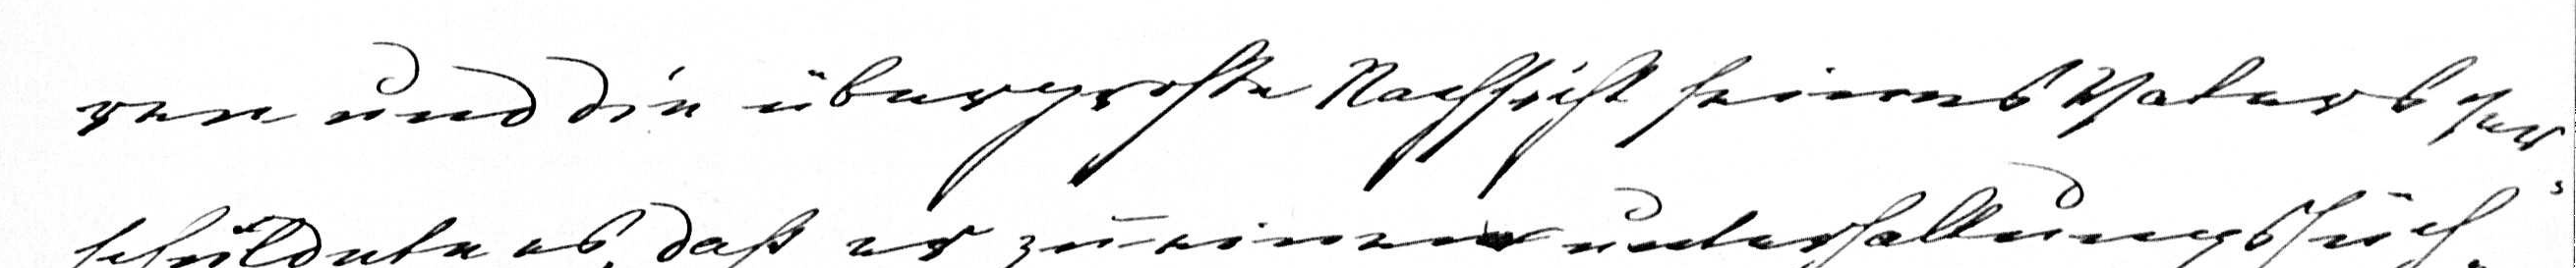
ren und die übergroße Nachsicht seines Vaters ver¬
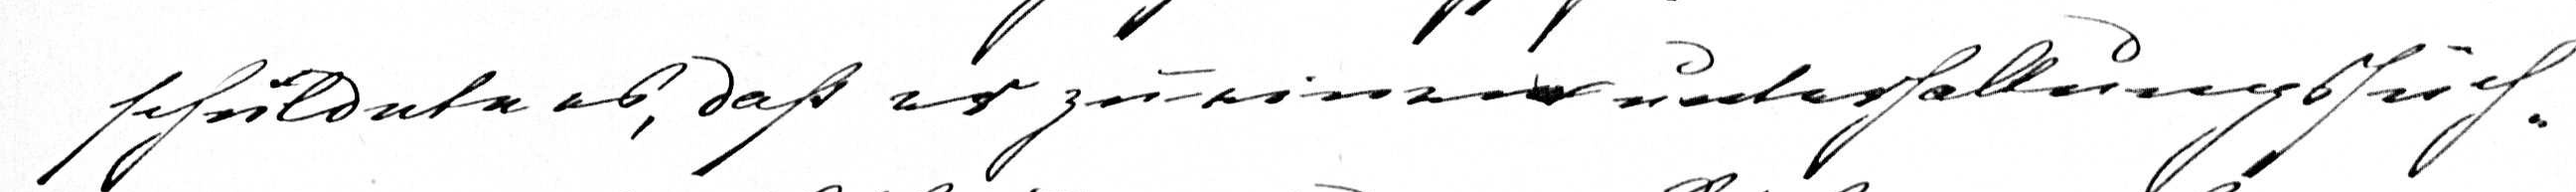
schuldete es, daß er zu einer unterhaltungssüch¬
